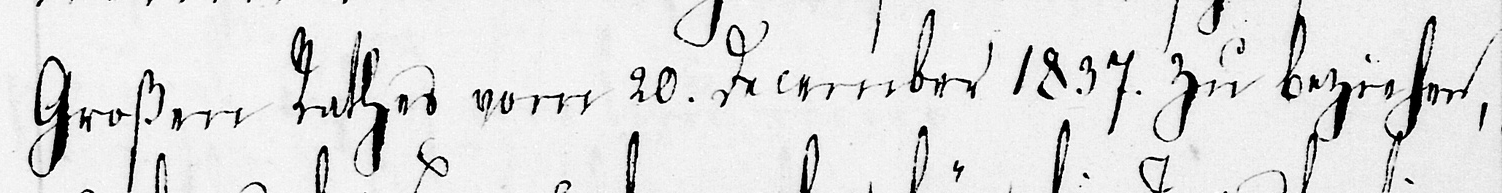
Großen Rathes vom 20. December 1837. zu beziehen,
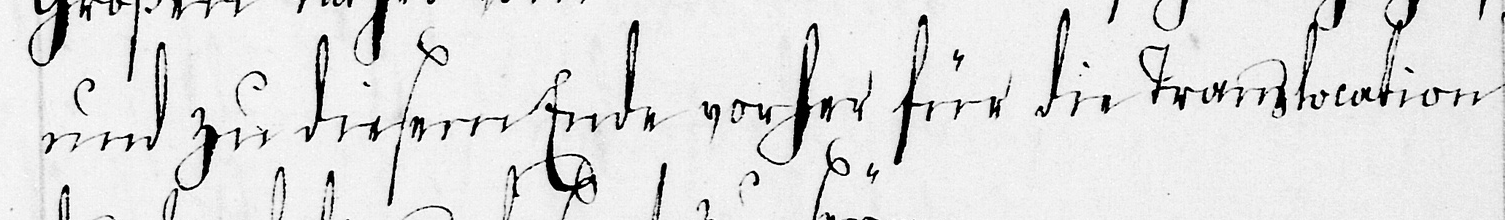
und zu diesem Ende vorher für die Translocation
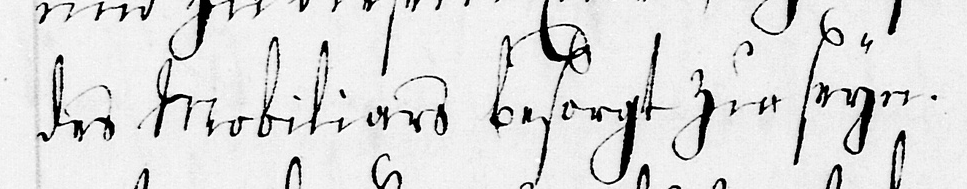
des Mobiliars besorgt zu seyn.
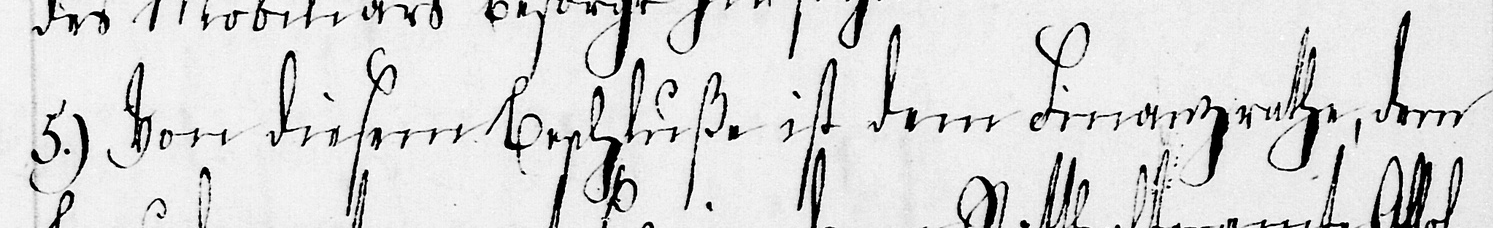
5.) Von diesem Beschluße ist dem Finanzrathe, dem
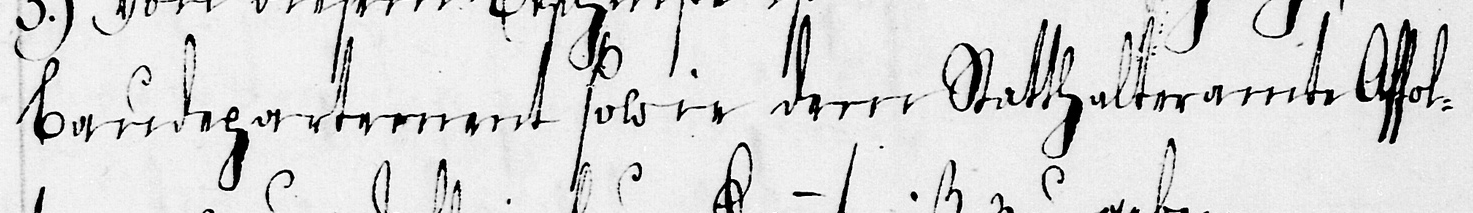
Baudepartement sowie dem Statthalteramte Affol¬
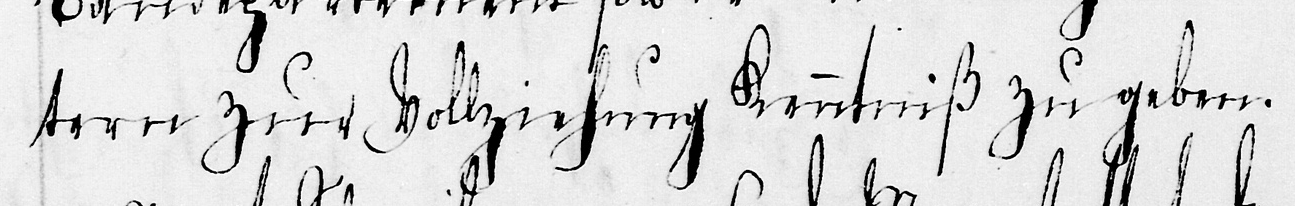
tern zur Vollziehung Kenntniß zu geben.
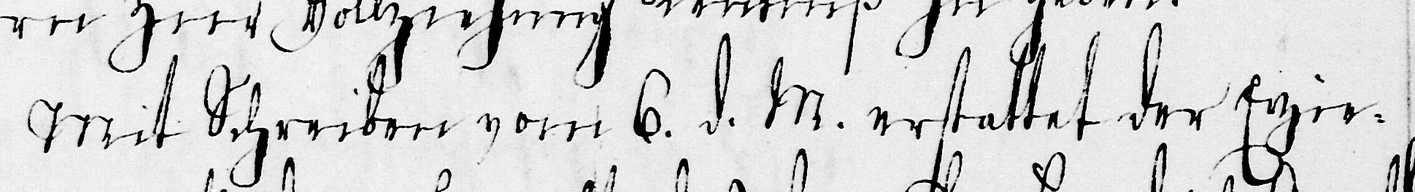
Mit Schreiben vom 6. d. M. erstattet der Erzie¬
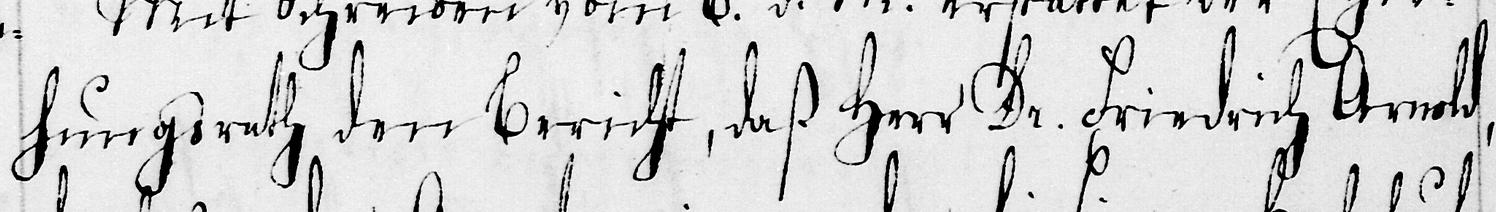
hungsrath den Bericht, daß Herr Dr. Friedrich Arno¬
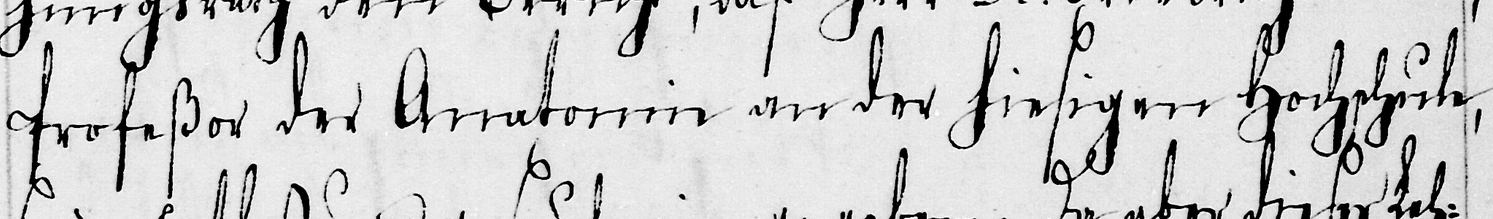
Profeßor der Anatomie an der hiesigen Hochschul¬
